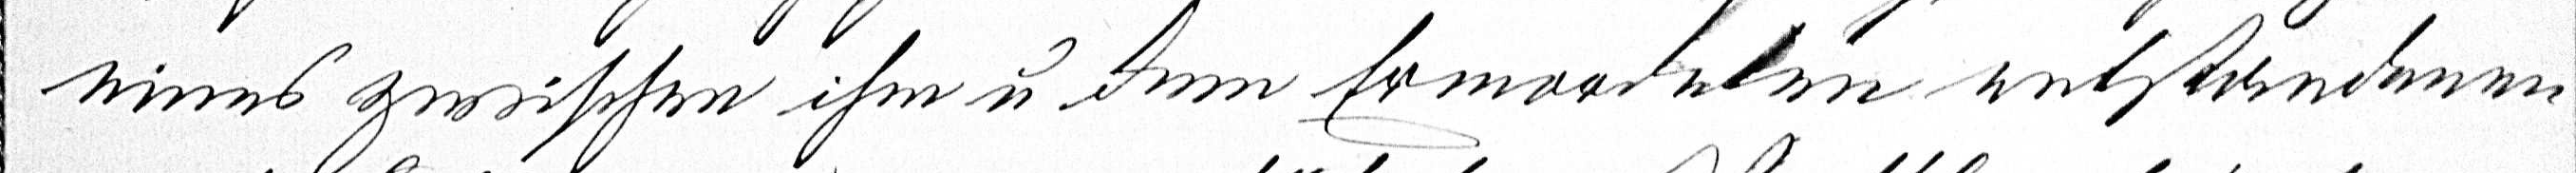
eines zwischen ihm u dem Ermordeten entstandenen
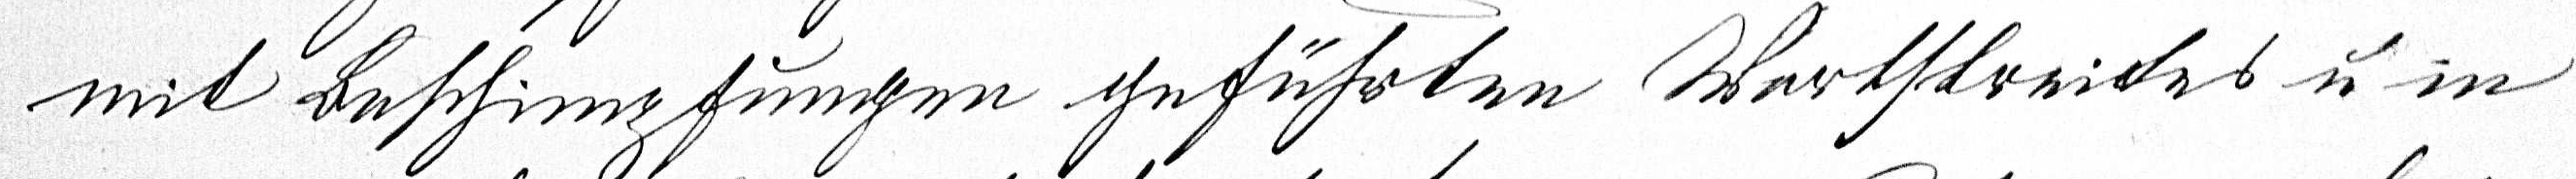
mit Beschimpfungen geführten Wortstreites u in
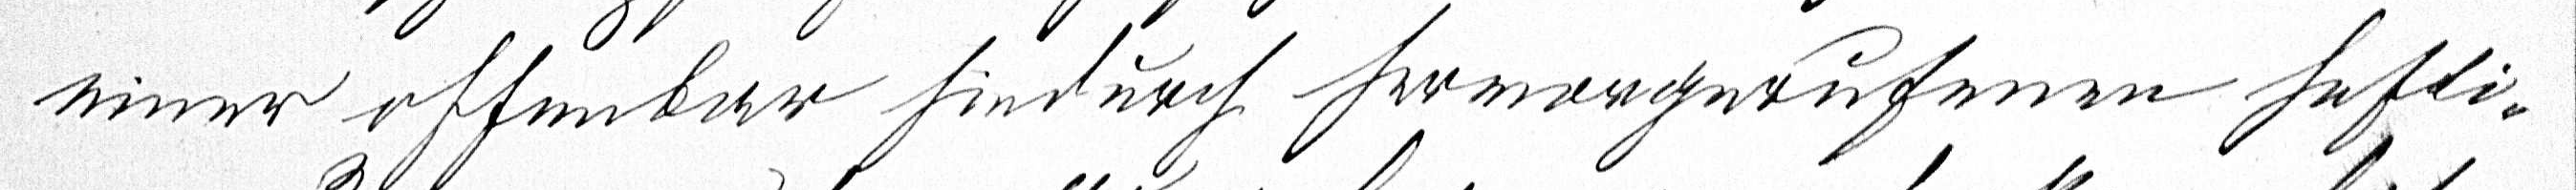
einer offenbar hiedurch hervorgerufenen hefti¬
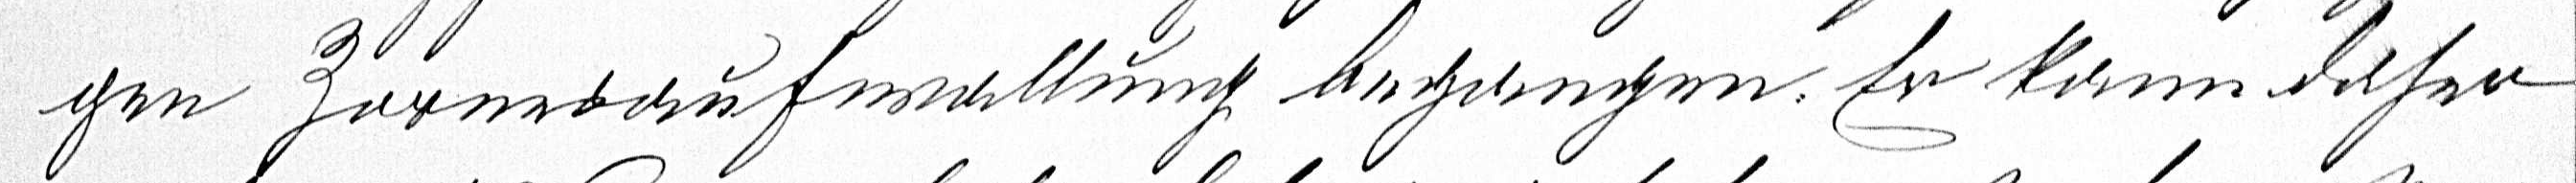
gen Zornesaufwallung begangen. Er kann daher
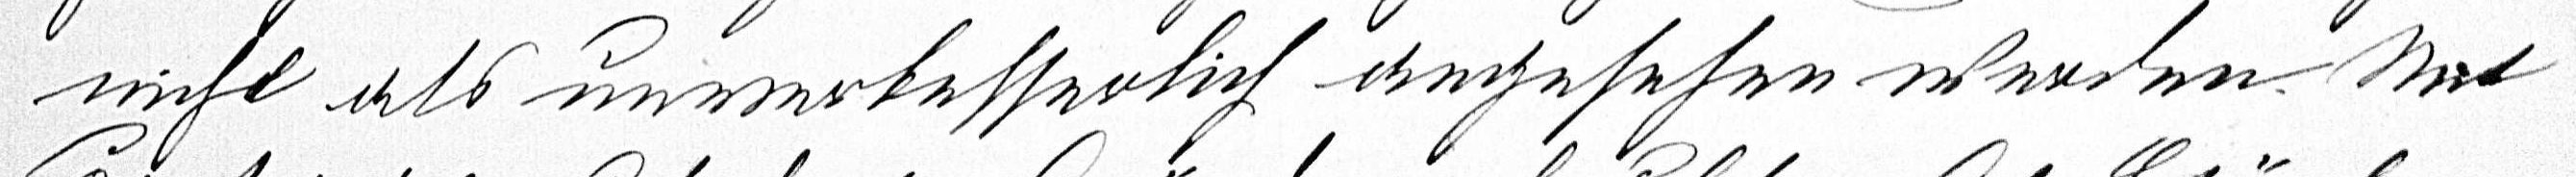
nicht als unverbesserlich angesehen werden. Mit
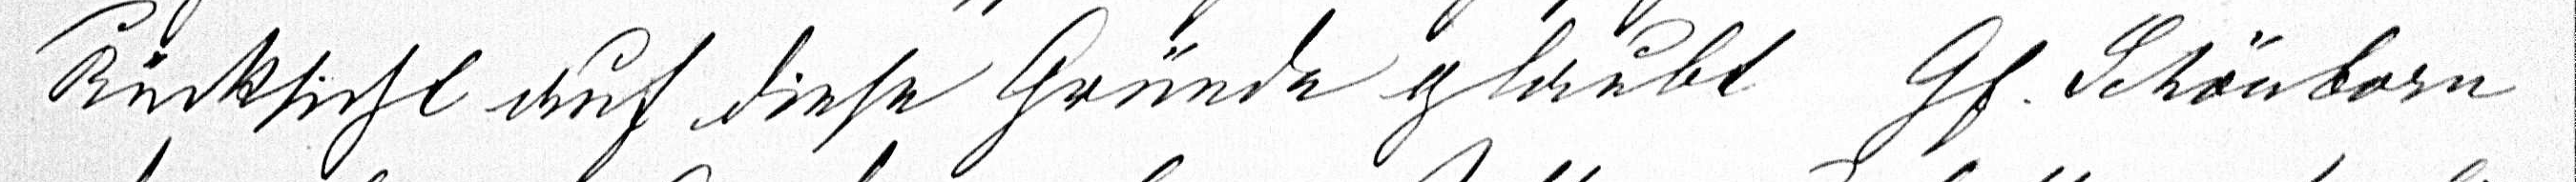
Rücksicht auf diese Gründe glaubt Gf. Schönborn
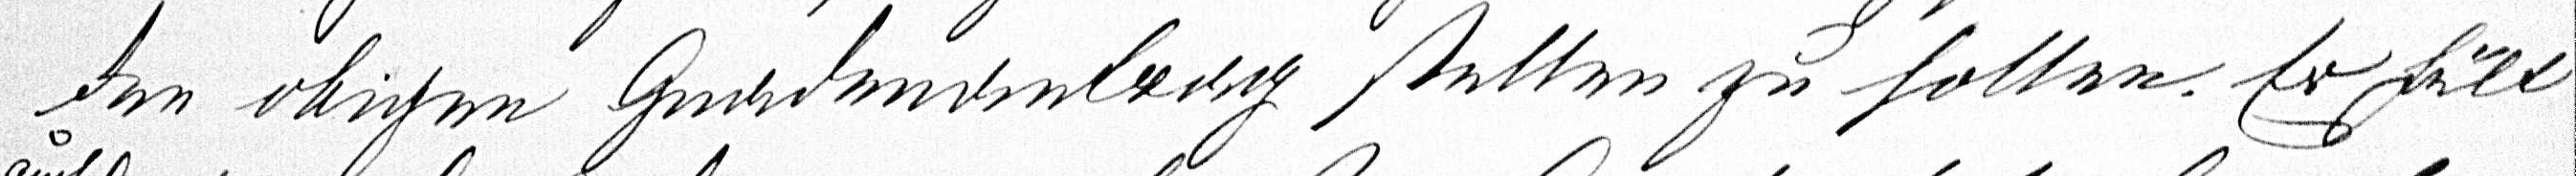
den obigen Gnadenantrag stellen zu sollen. Er hält
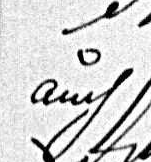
auch
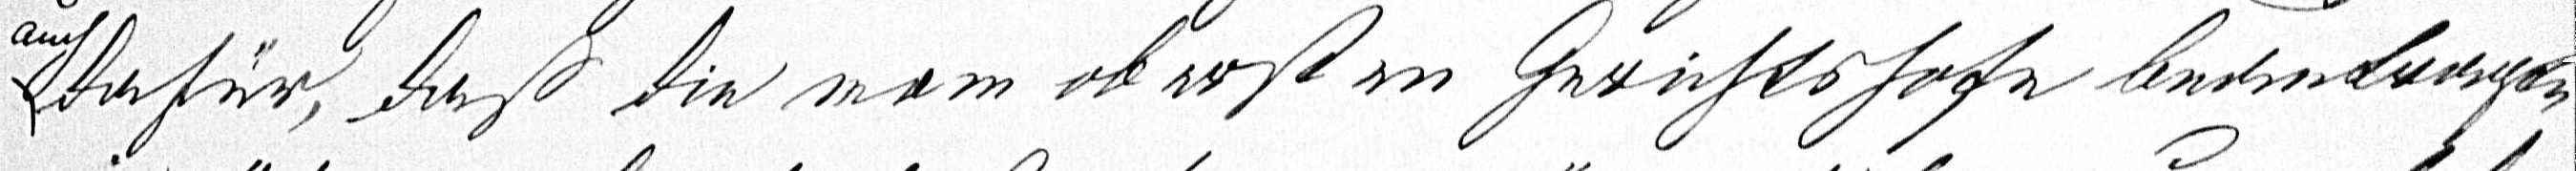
dafür, daß die nun obersten Gerichtshofe beantragte
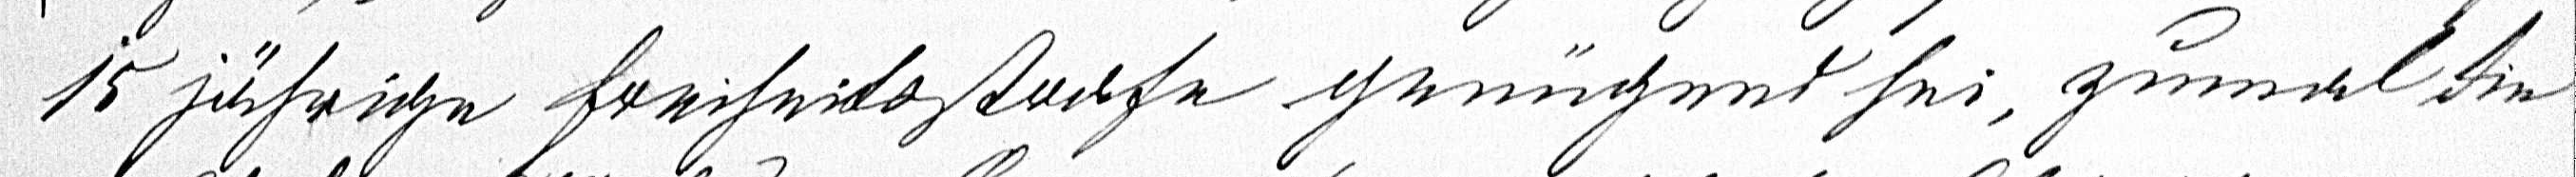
15jährige Freiheitsstrafe genügend sei, zumal die
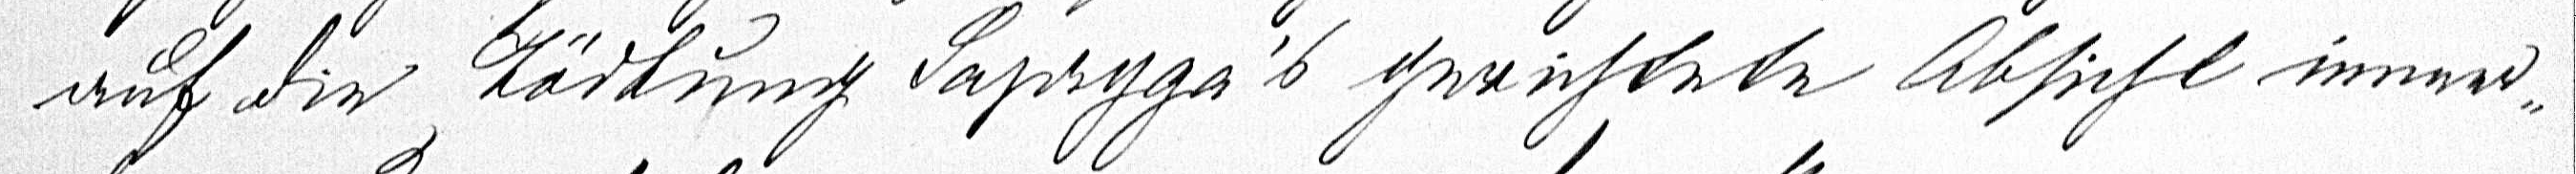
auf die Tödtung Sapryga’s gerichtete Absicht immer¬
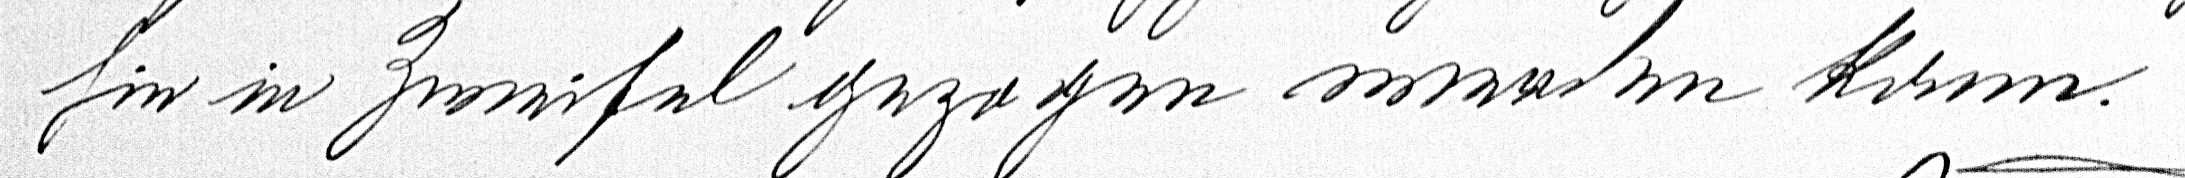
hin in Zweifel gezogen werden kann.
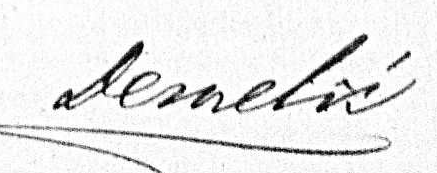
Demelić
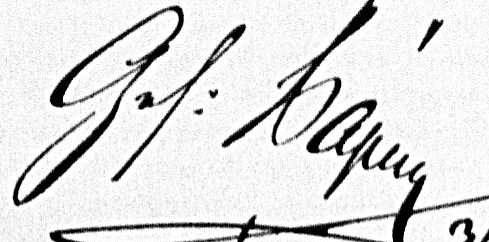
Ges. Papay
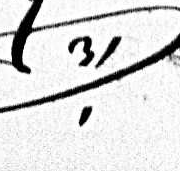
31/1
